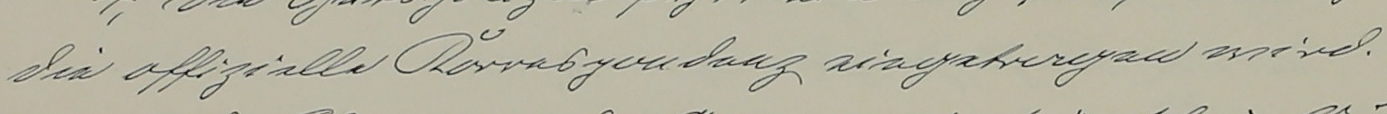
die offizielle Korrespondenz eingetragen wird.
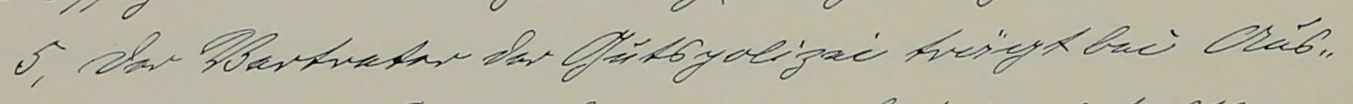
5. Der Vertreter der Gutspolizei trägt bei Aus-
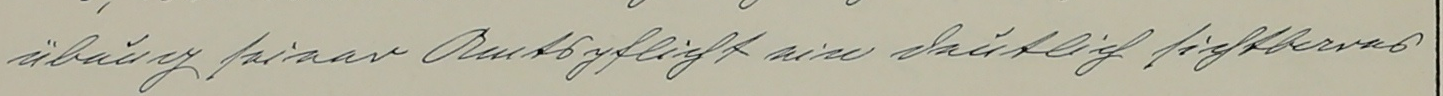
übung seiner Amtspflicht ein deutlich sichtbares
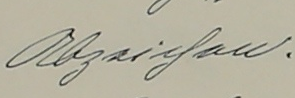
Abzeichen.
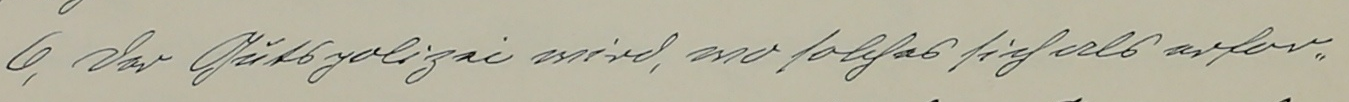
6. Der Gutspolizei wird, wo solches sich als erfor-
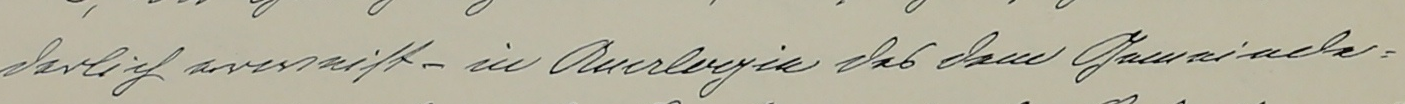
derliche erweist – in Analogie des dem Gemeinde-
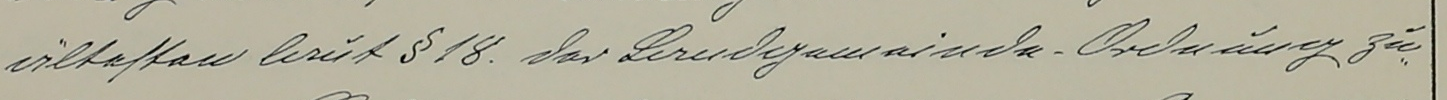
ältesten laut § 18. der Landgemeinde-Ordnung zu-
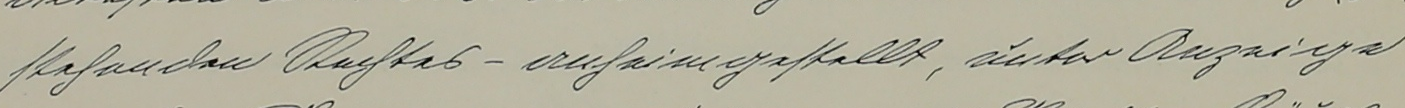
stehenden Rechtes – anheimgestellt, unter Anzeige
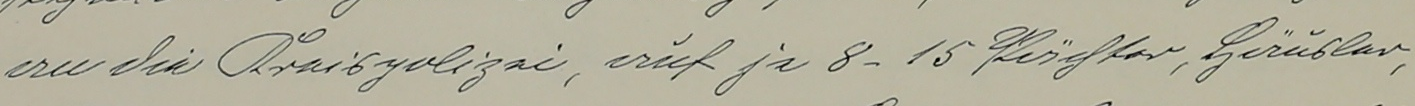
an die Kreispolizei, auf je 8-15 Pächter, Häusler,
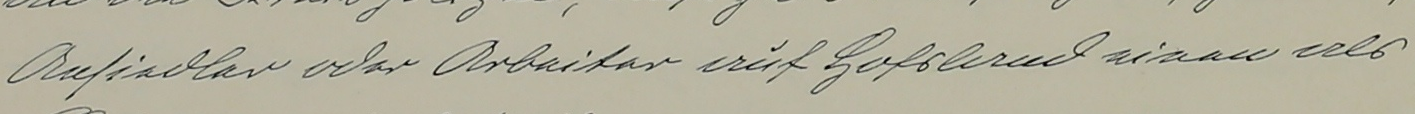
Ansiedler oder Arbeiter auf Hofsland einen als
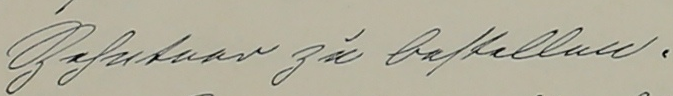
Zehntner zu bestellen.
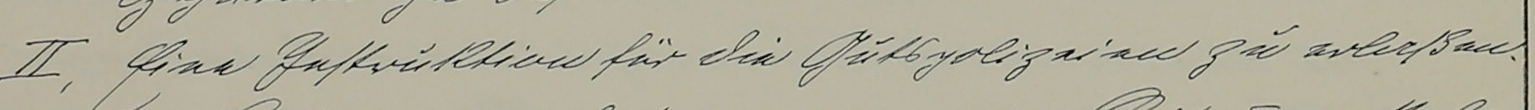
II. Eine Instruktion für die Gutspolizeien zu erlaßen.
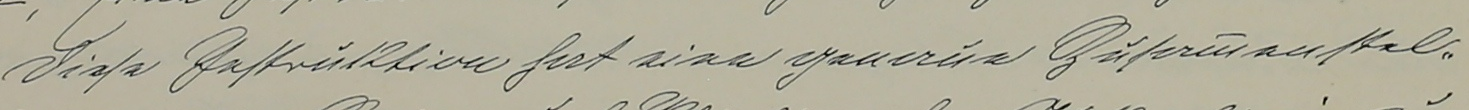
Diese Instruktion hat eine genaue Zusammenstel-
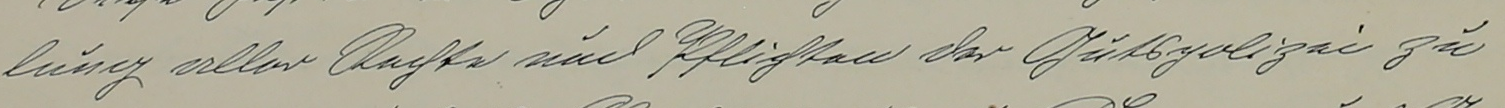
lung aller Rechte und Pflichten der Gutspolizei zu
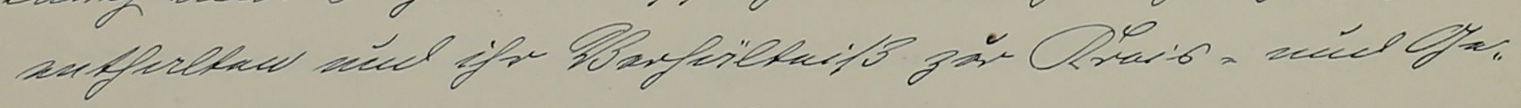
enthalten und ihr Verhältniß zur Kreis- und Ge-
